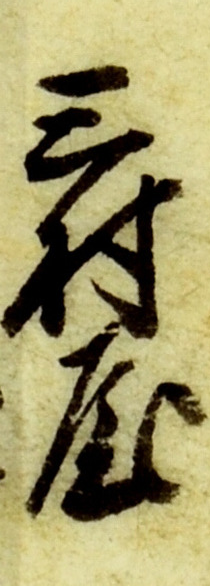三村屋
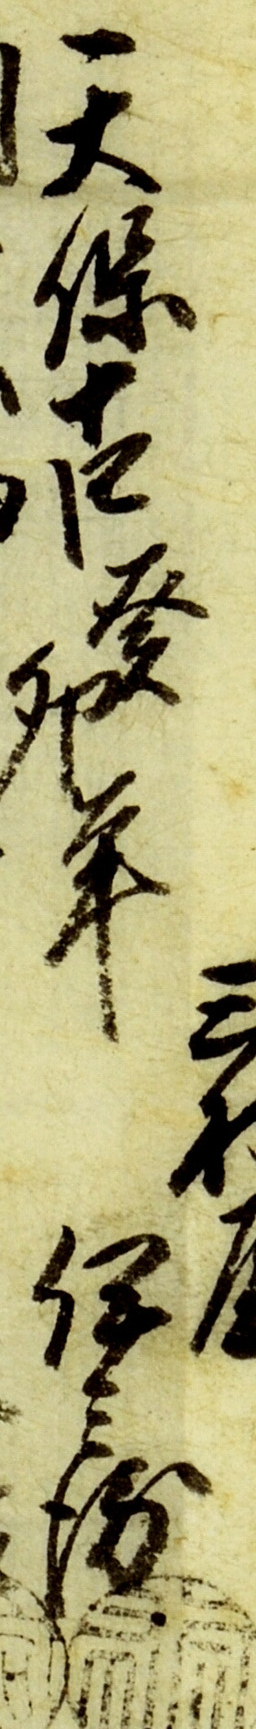天保十四癸卯年伊兵衛印
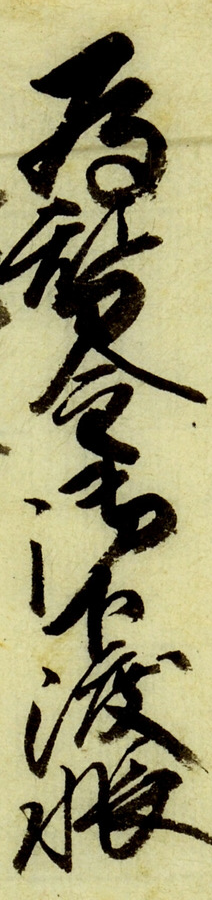為替金御下渡帳
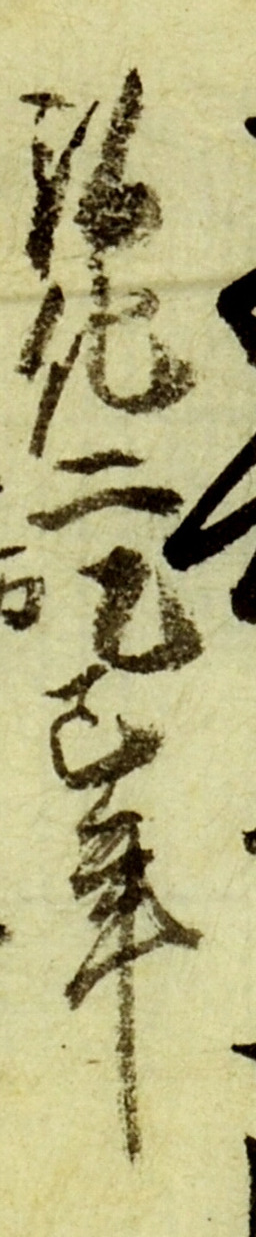弘化二己巳年
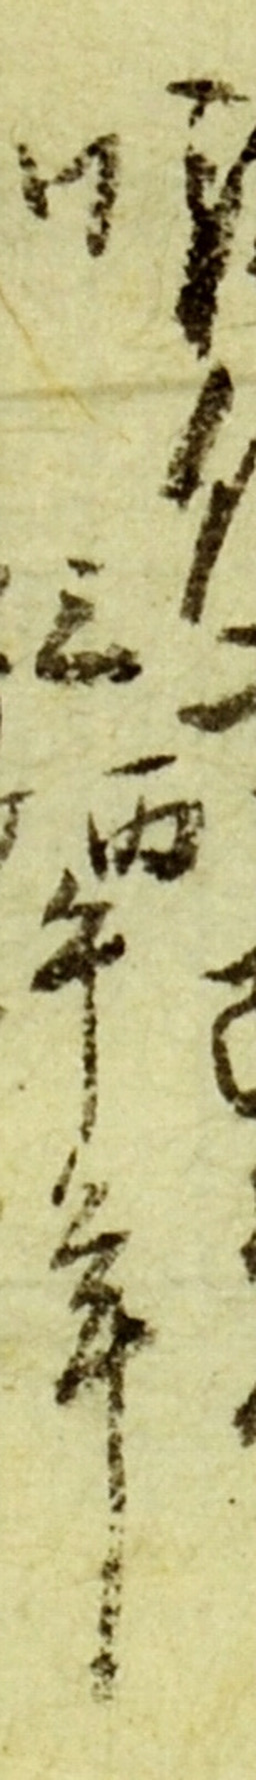同三丙午年
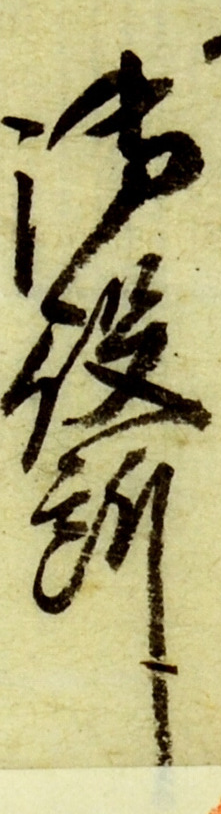御役所
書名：為替金御下渡帳
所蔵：伊那市立高遠町図書館・合同会社AMANE
